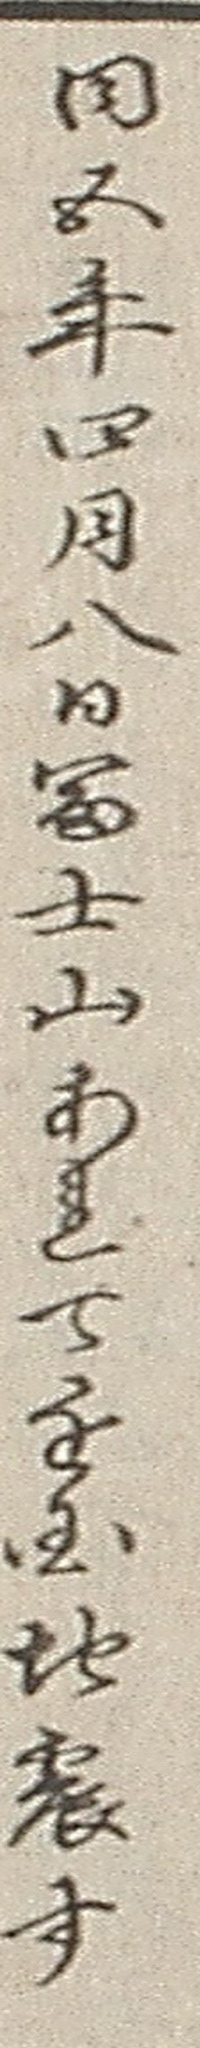同五年四月八日富士山あれて近国地震す
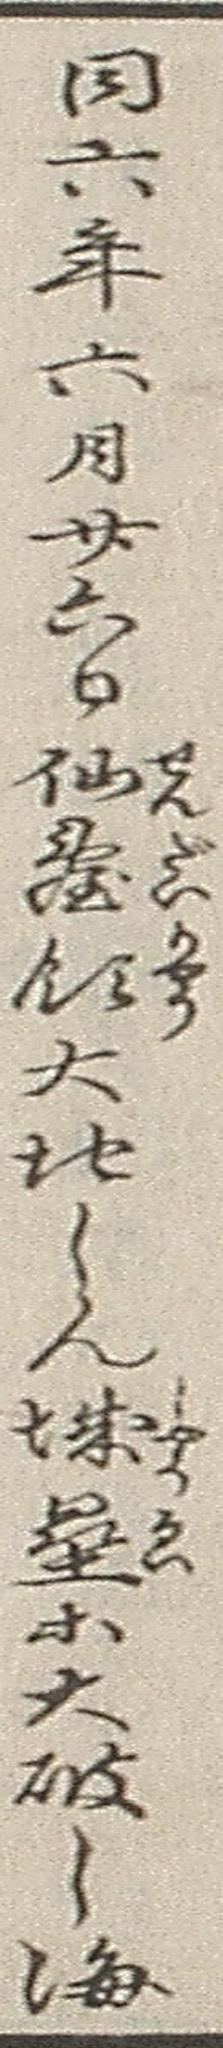同六年六月廿六日仙台領大地しん城塁等大破し海
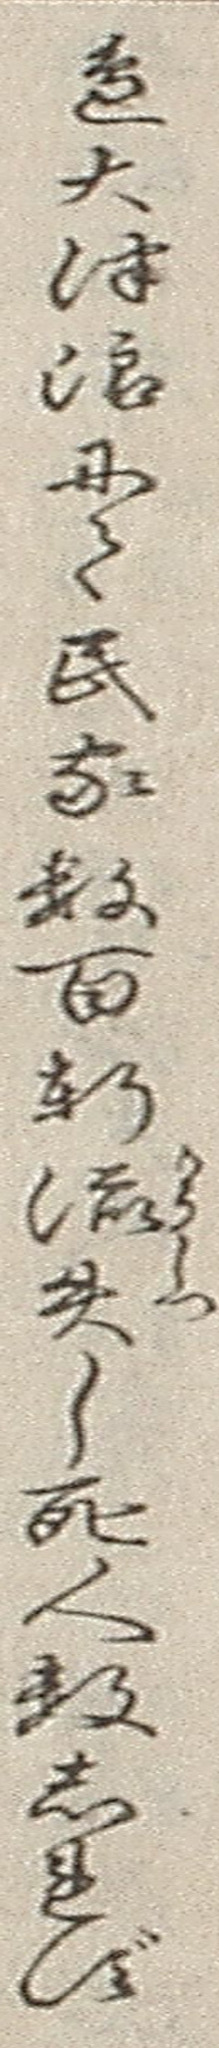辺大津浪にて民家数百軒流失し死人数しれず
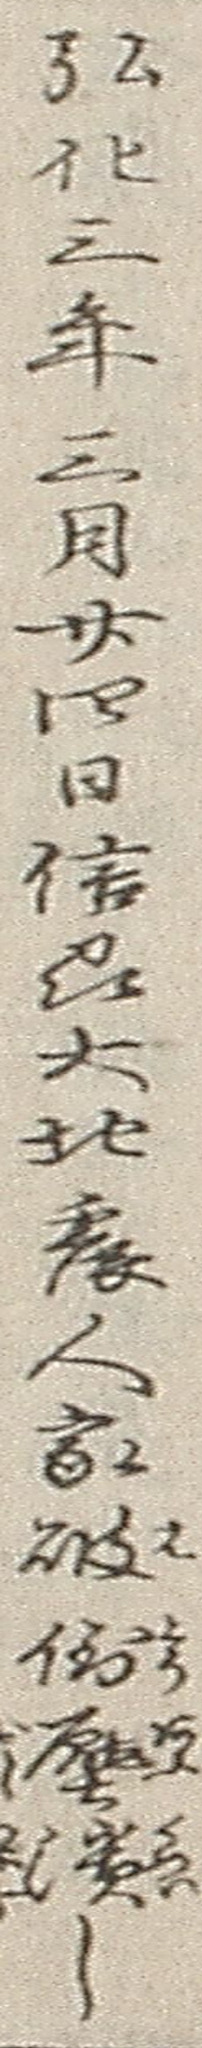弘化三年三月廿四日信州大地震人家破倒圧潰し
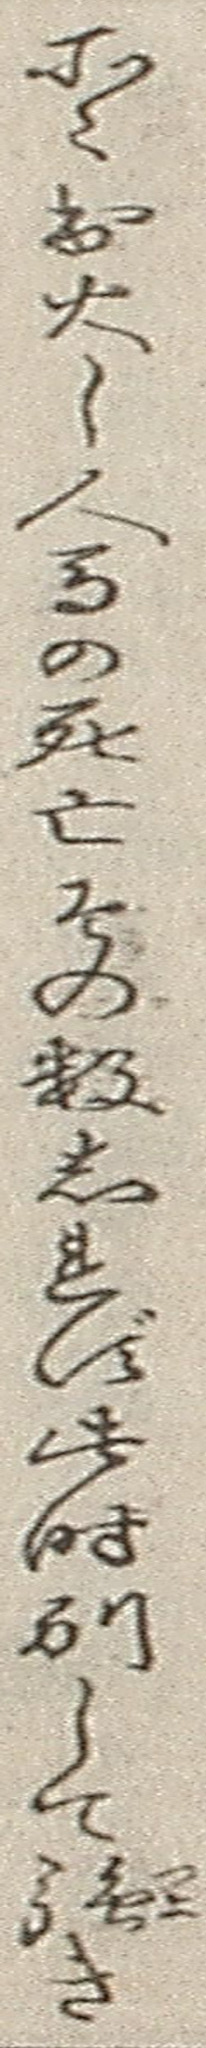所々出火し人馬の死亡その数しれず此時別して強き
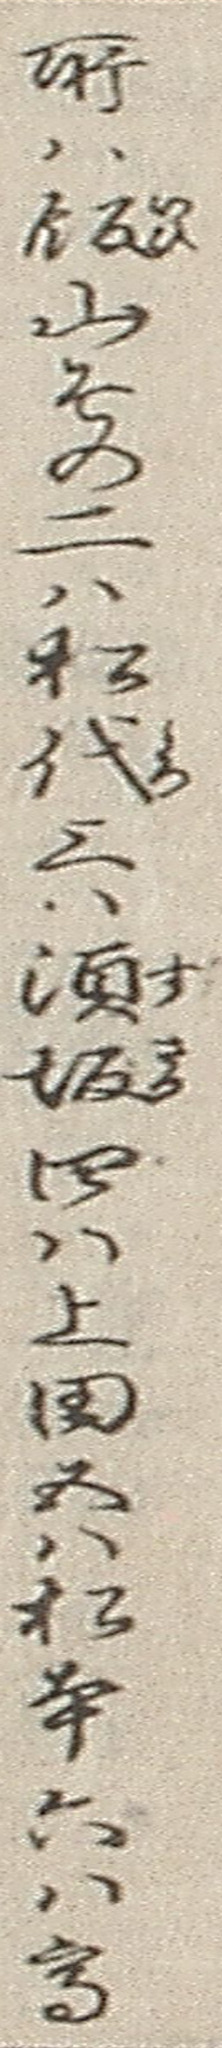所は飯山その二は松代三は須坂四は上田五は松本六は高

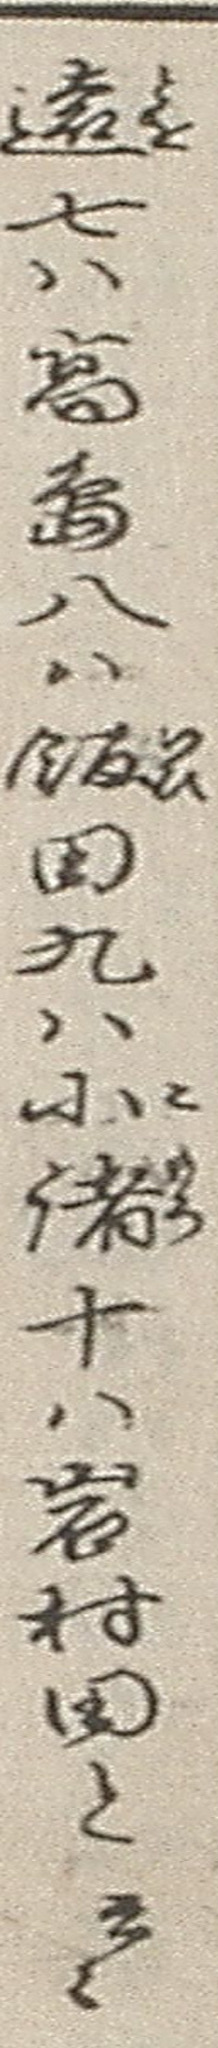遠七は高島八は飯田九は小諸十は岩村田と云々
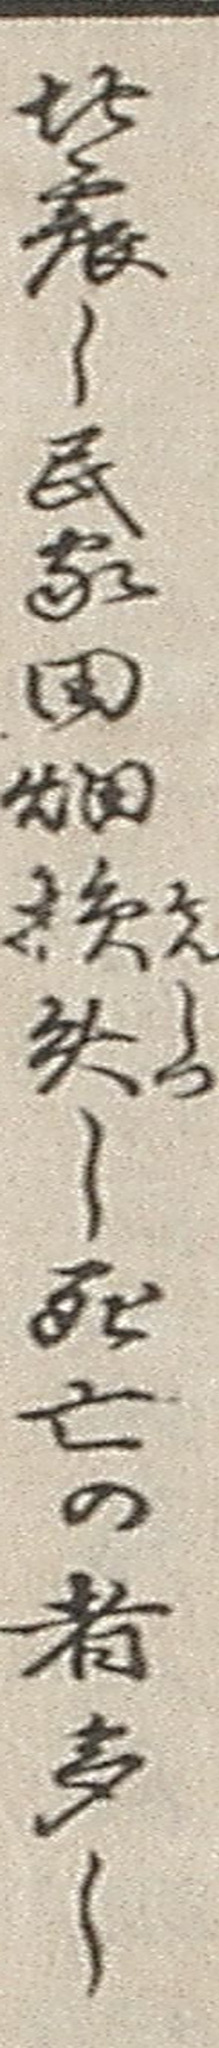地震し民家田畑損失し死亡の者多し
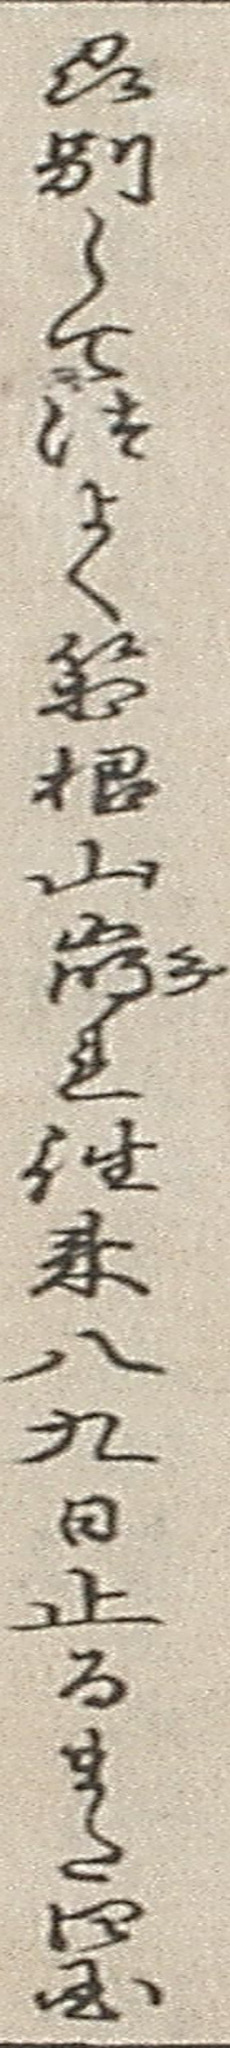州別してつよく箱根山崩れ往来八九日止るまた四国
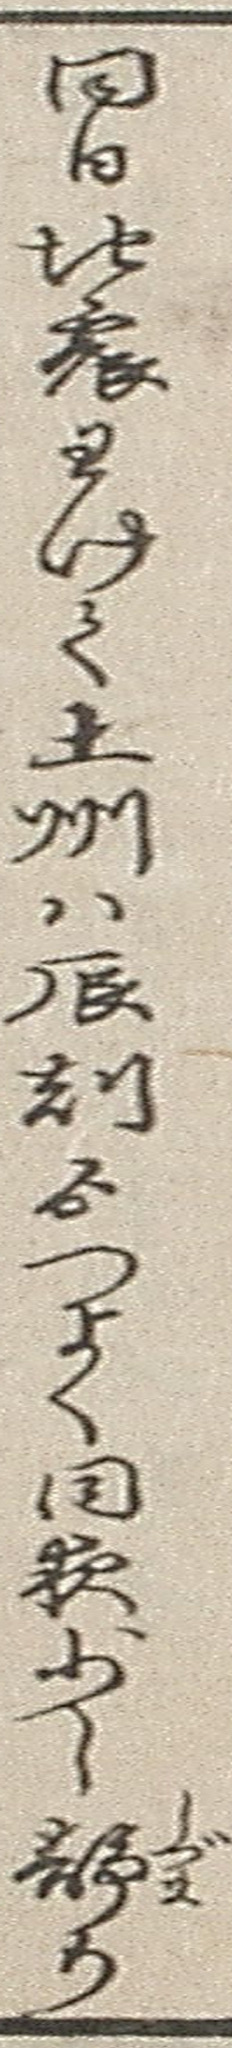同日地震わけて土州は辰刻ゟつよく同夜少し静り
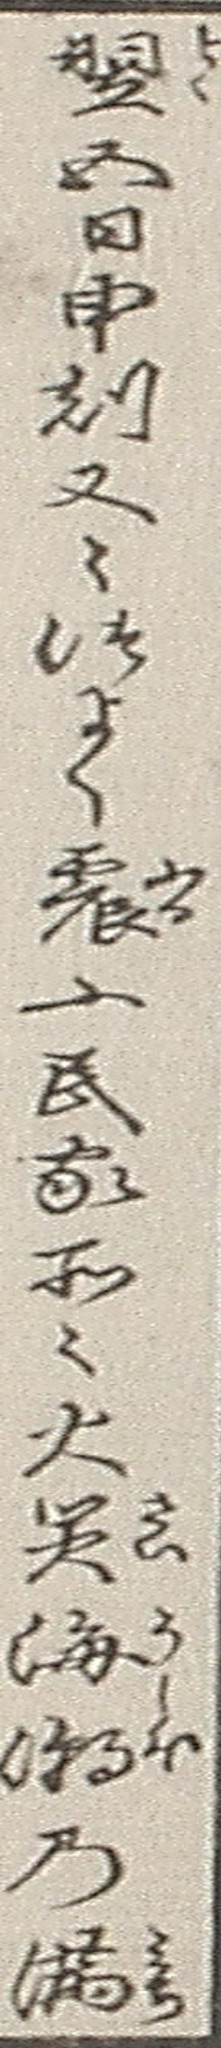翌五日申刻又々つよく震ふ民家所々火災海潮の満
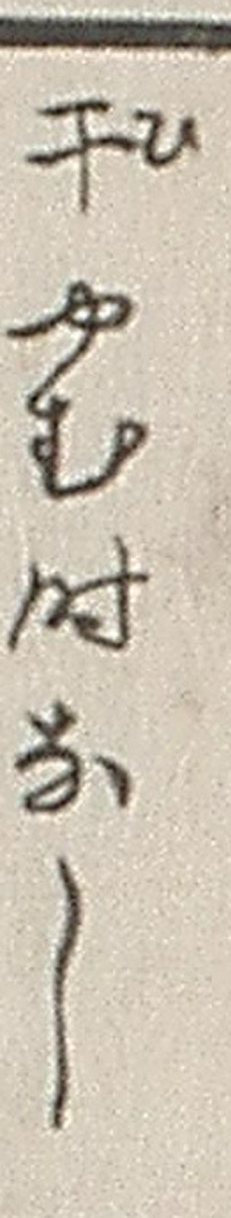干やむ時なし
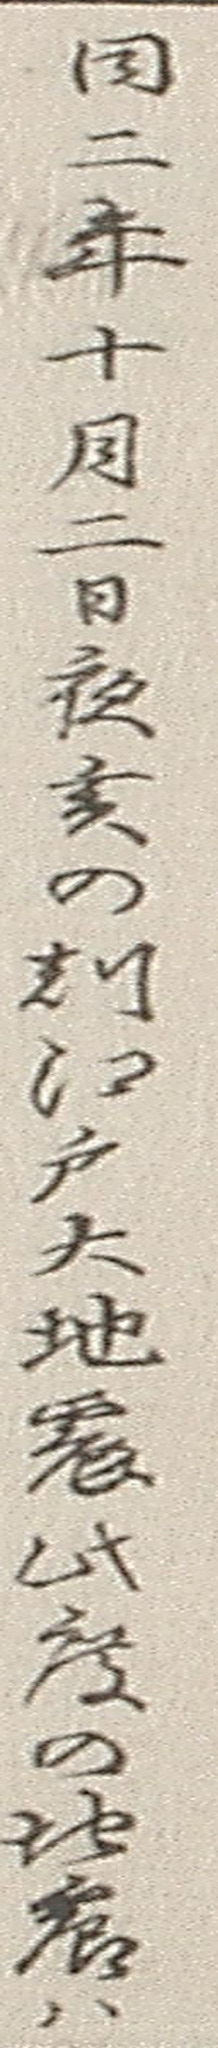同二年十月二日夜亥の刻江戸大地震此度の地震は
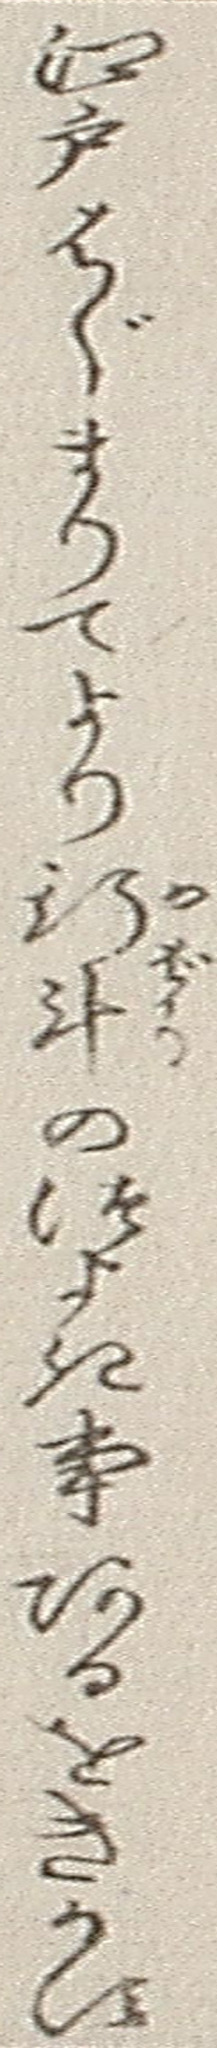江戸はじまりてより斯斗のつよき事あるをきかす
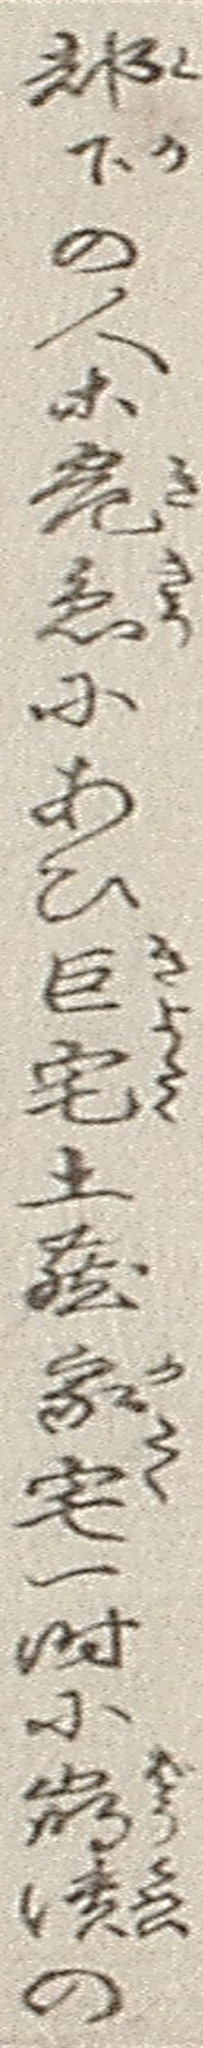都下の人等危急にあひ巨宅土蔵家宅一時に崩潰の
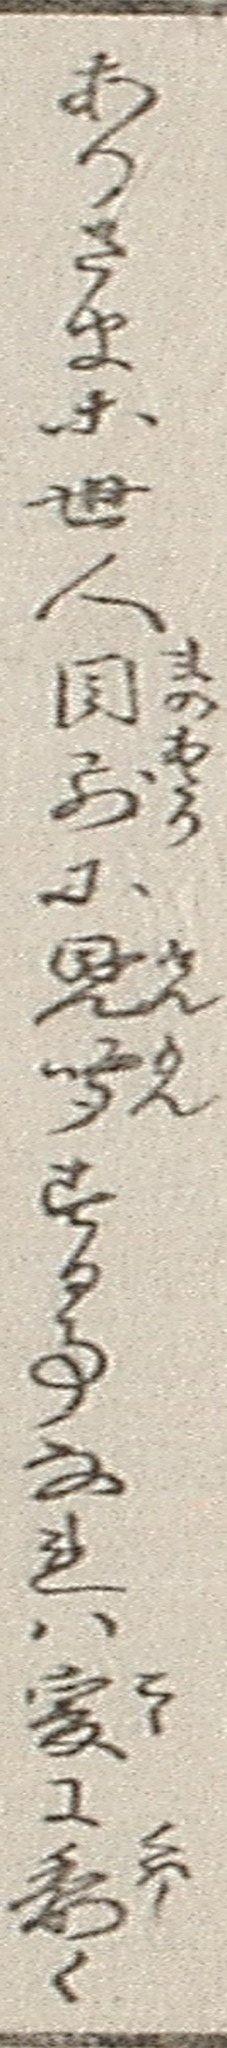ありさま等世人目前に見聞する事なれは爰に委く
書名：大地震暦年考　全
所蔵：東京大学地震研究所図書室 Earthquake Research Institute Library, The University of Tokyo, JAPAN
